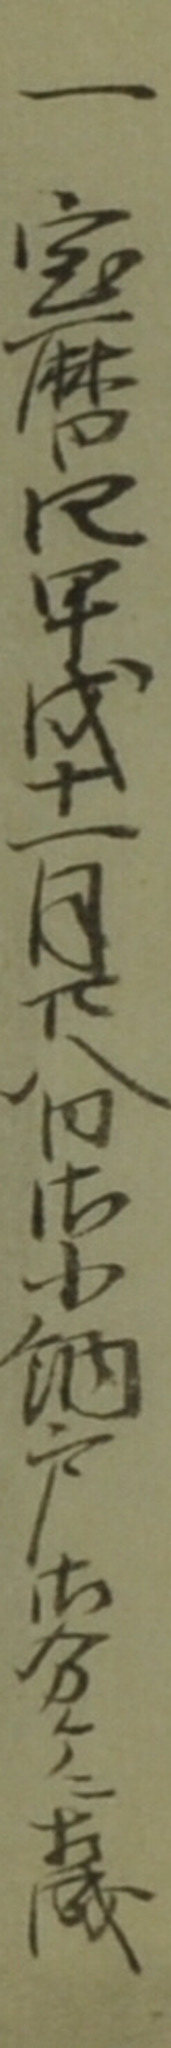一宝暦四甲戌十一月廿八日御小納戸御分ヶニ相成
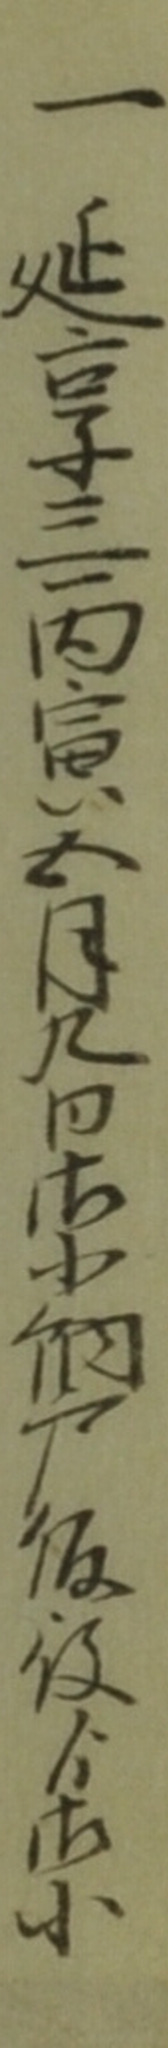一延享三丙寅五月九日御小納戸仮役ゟ御小
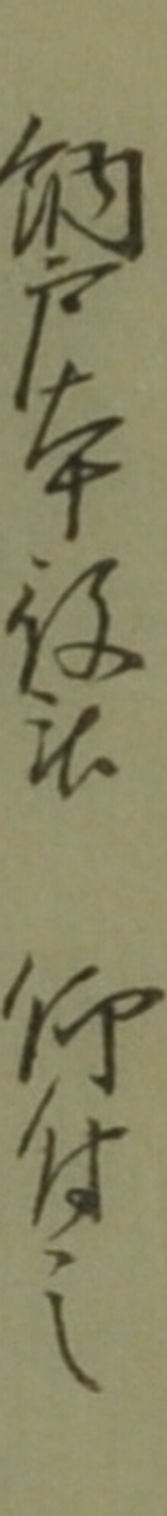納戸本役被仰付之
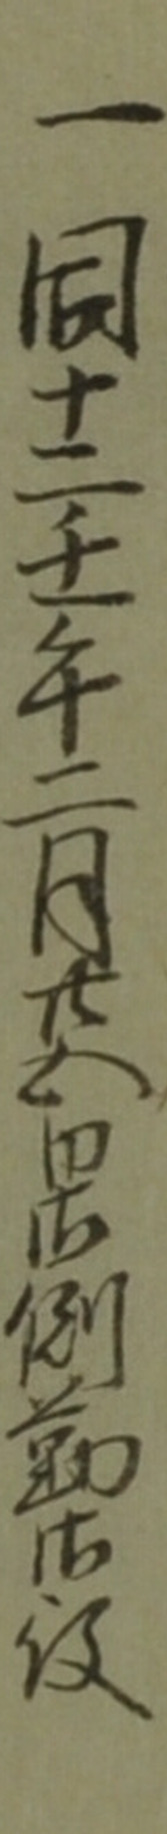一同十二壬午二月廿五日御側勤御役
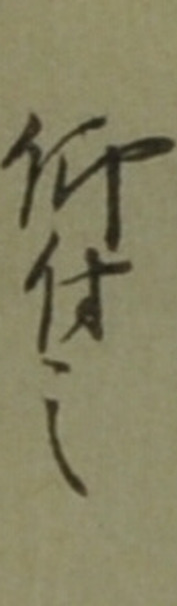仰付之
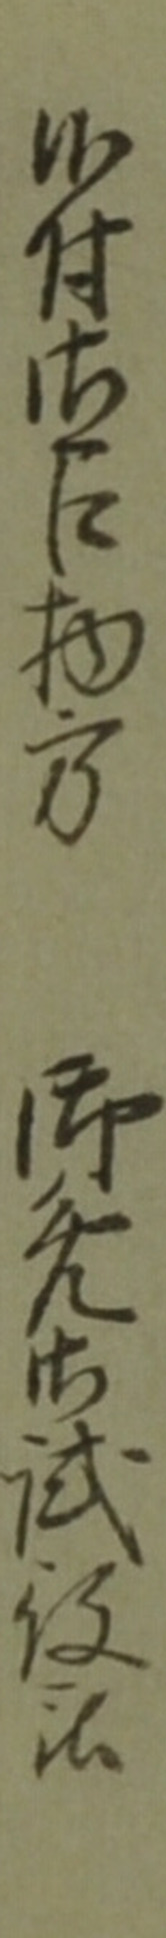候付御召物方御免御試役被
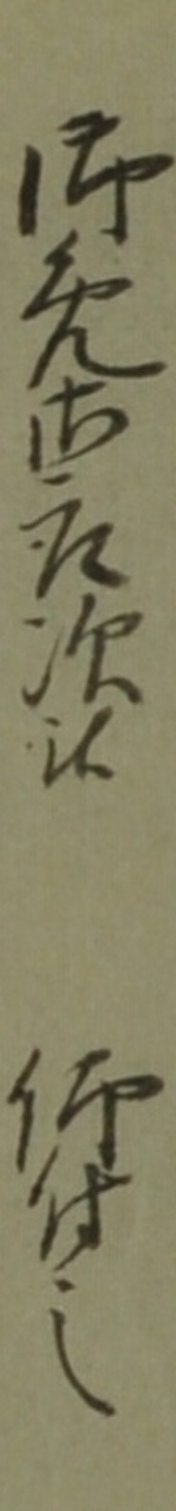御免御取次被仰付之
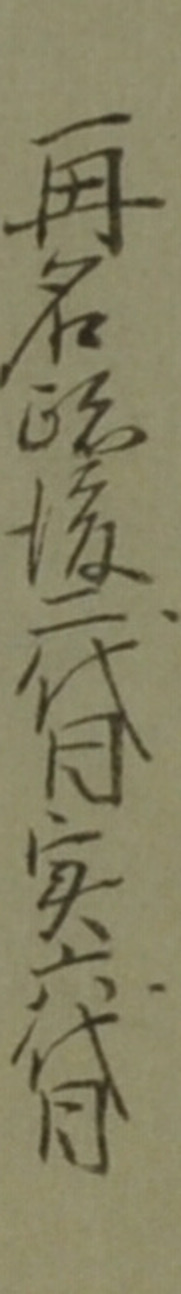再名跡後二代目実六代目
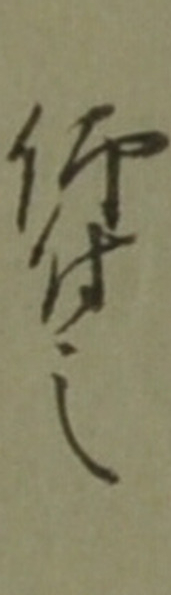仰付之
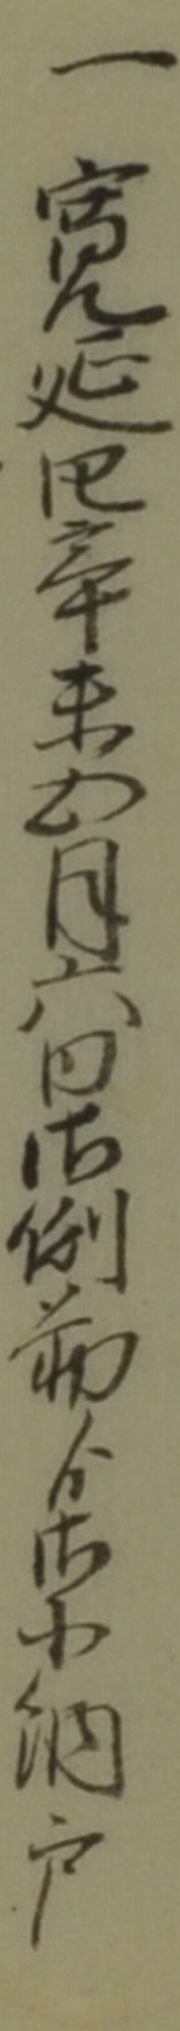一寛延四辛未五月六日御側勤ゟ御小納戸
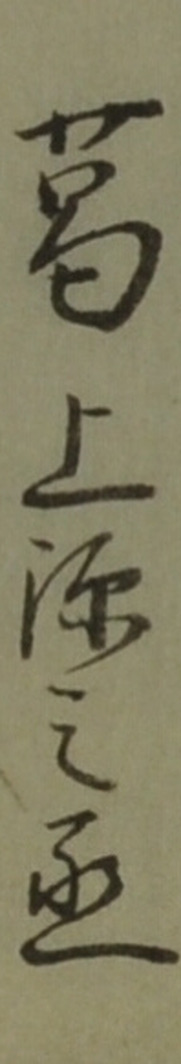葛上源之丞
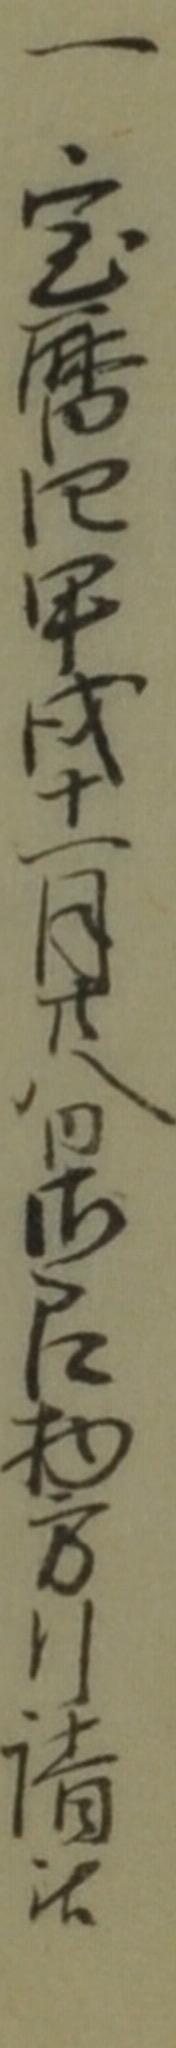一宝暦四甲戌十一月廿八日御召物方引請被
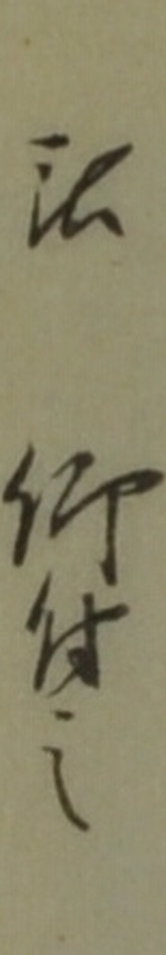被仰付之
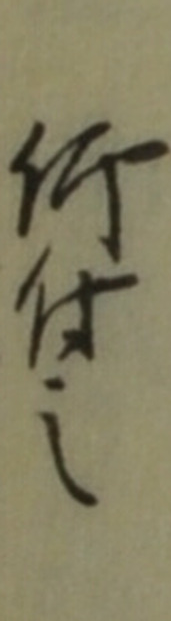仰付之
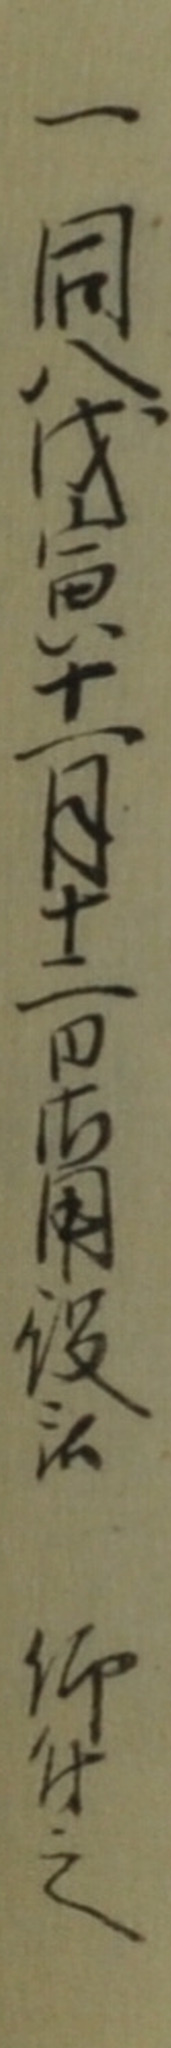一同八戊寅十一月十二日御用役被仰付之
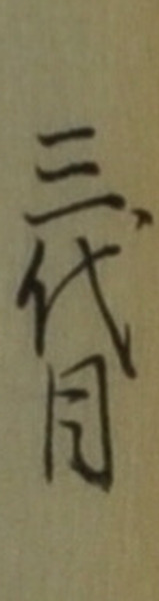三代目
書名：諸御役代々録（四）
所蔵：伊那市立高遠町図書館・合同会社AMANE
